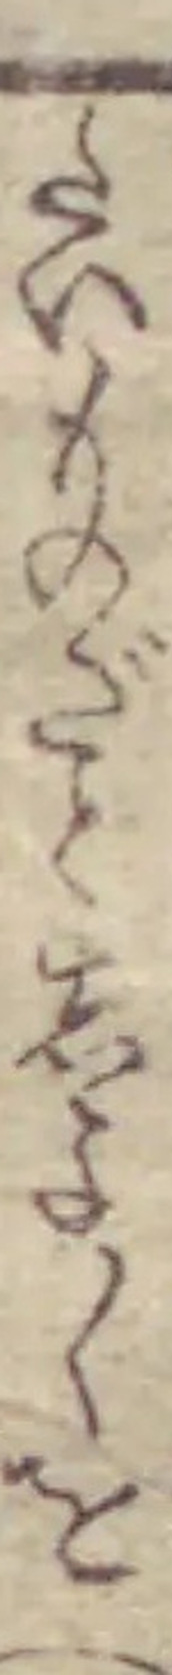たいものだとしよ〳〵を
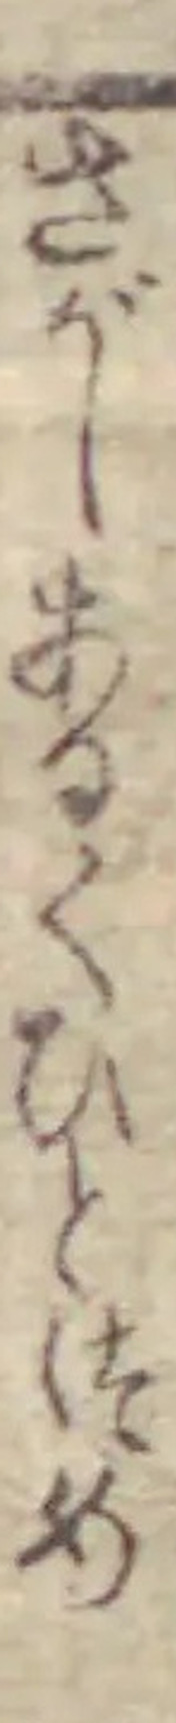さがしあるくひとつめ
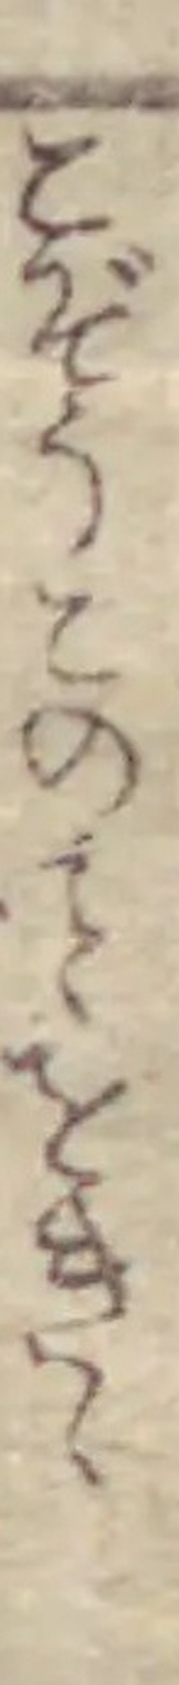こぞうこのことをきゝて
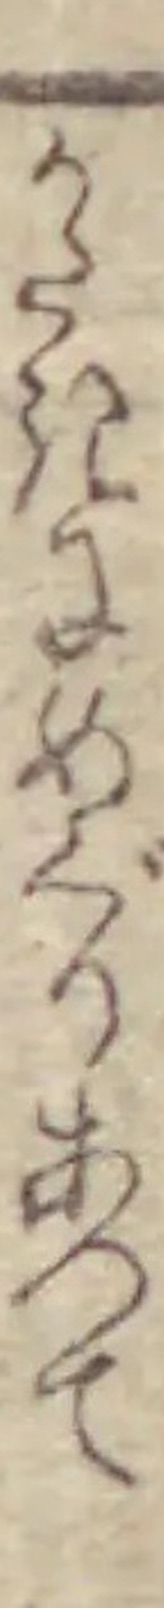かたきにめぐりあつて
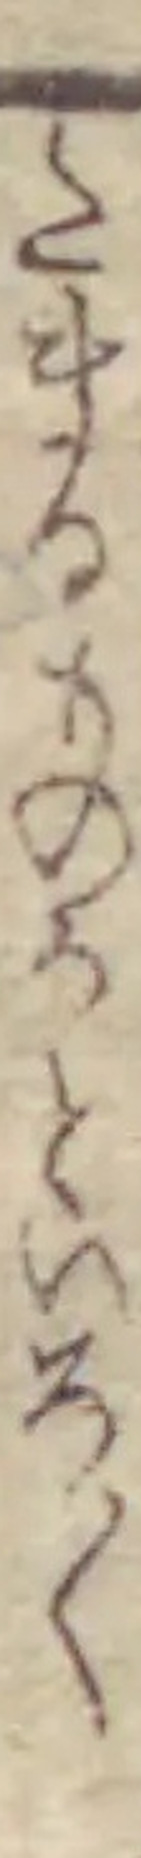たまるものかといろ〳〵
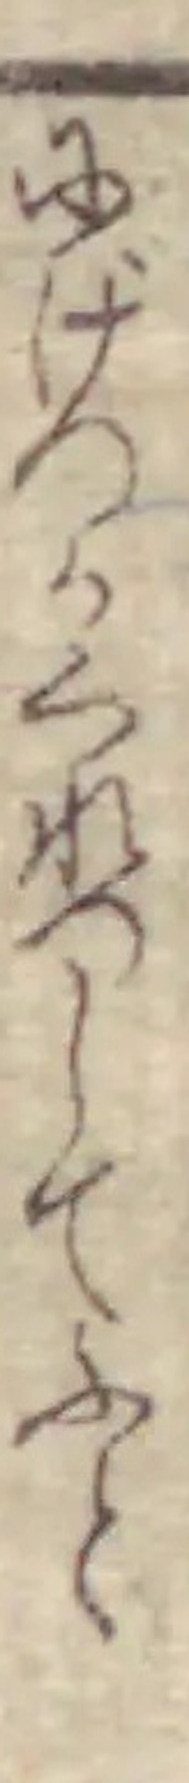にげつかくれつしてふと
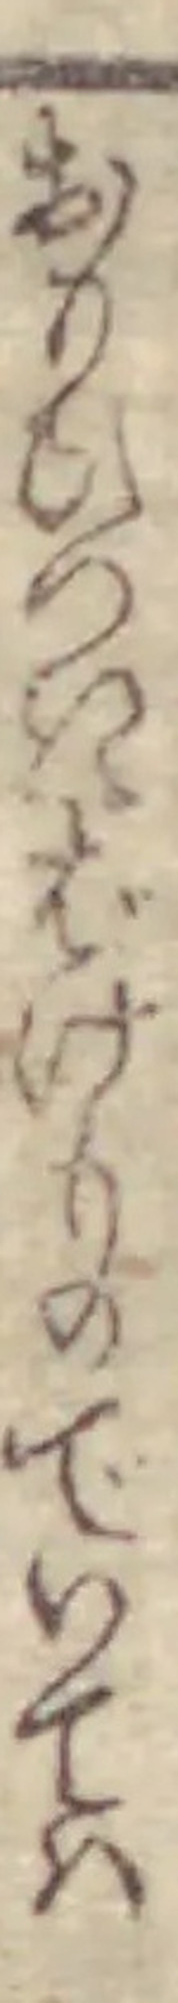おもひつきばけものでいては
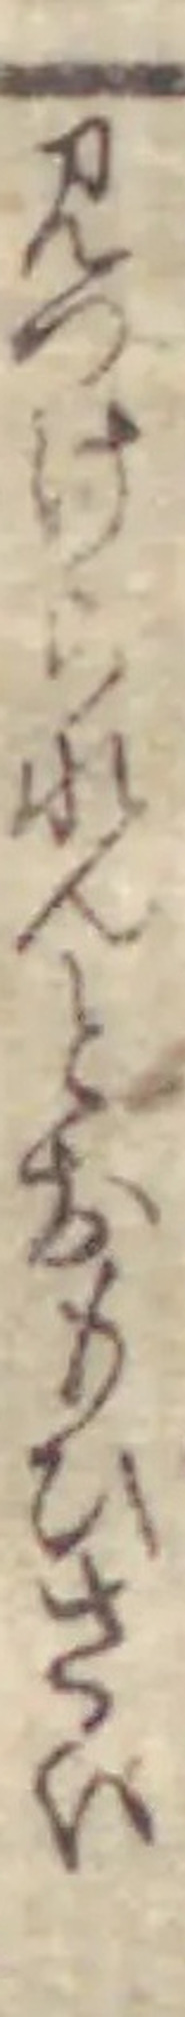見つけられんとおもひさい
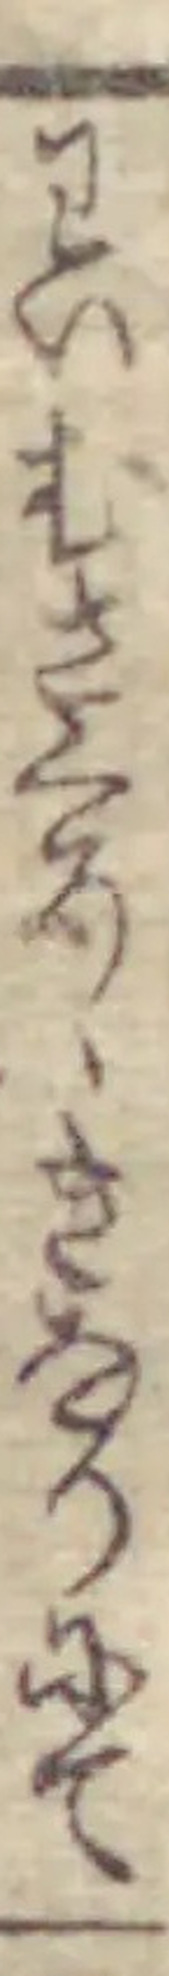わいむさくろしきなりにて
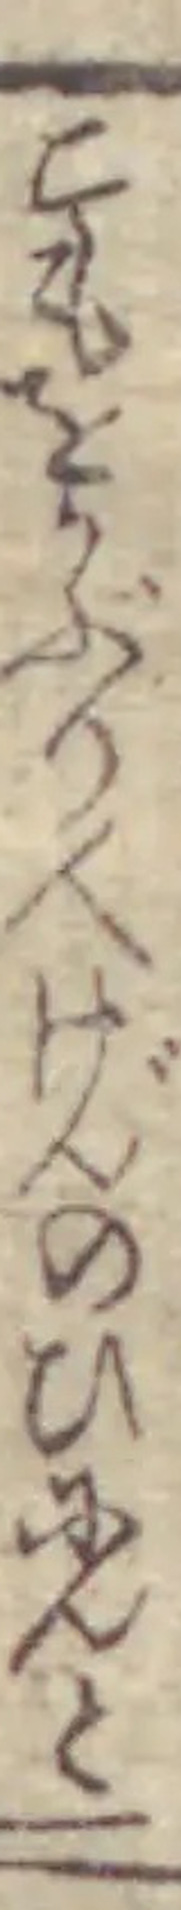こもをかぶり人げんのひにんと
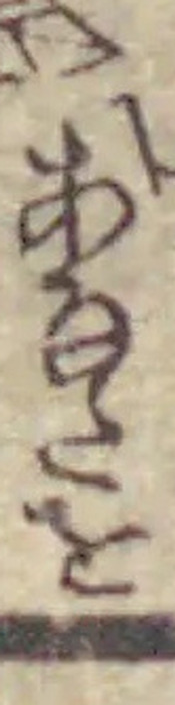〽あなたを
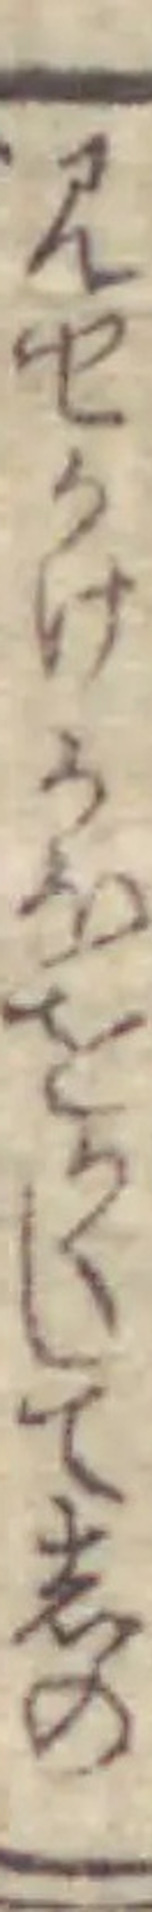見せかけかほをかくしてしの
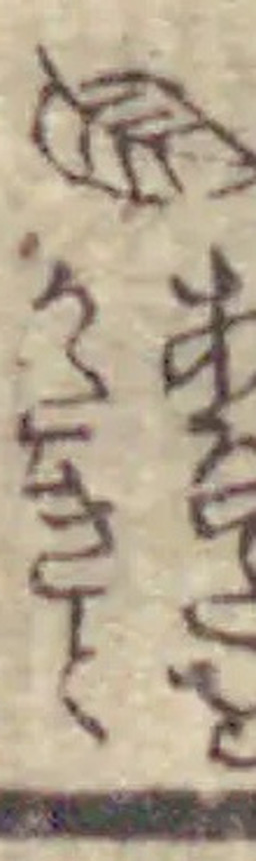かたきと
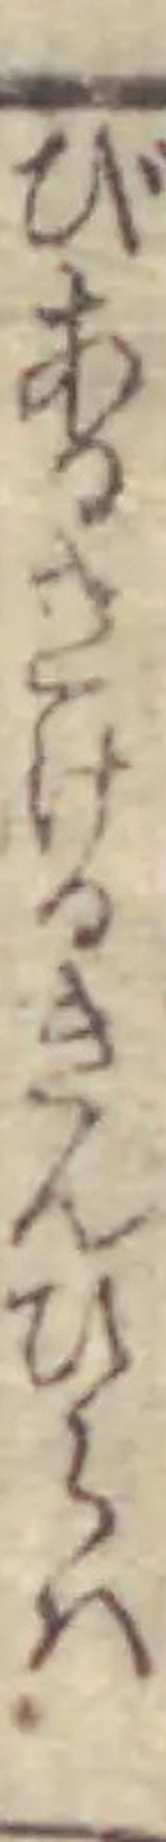びあるきけるきんひらは
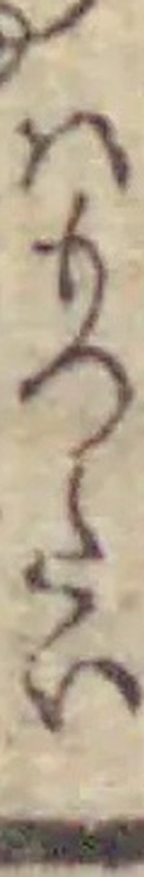はもつたい
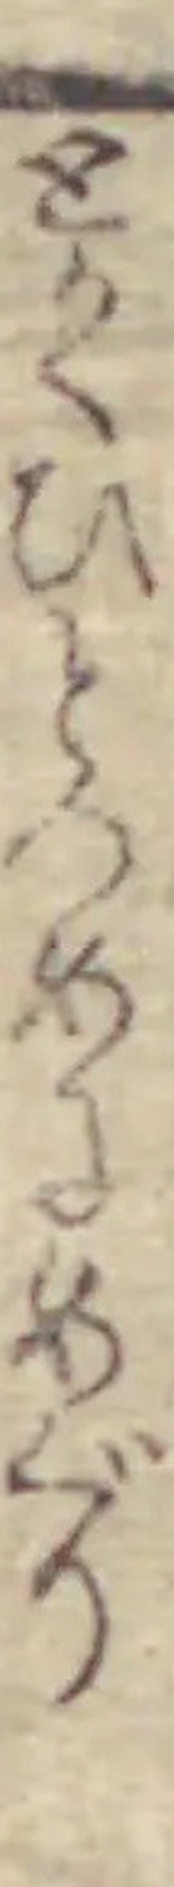とかくひとつめにめぐり
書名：化物敵討 2巻
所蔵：国立国会図書館 National Diet Library, JAPAN
